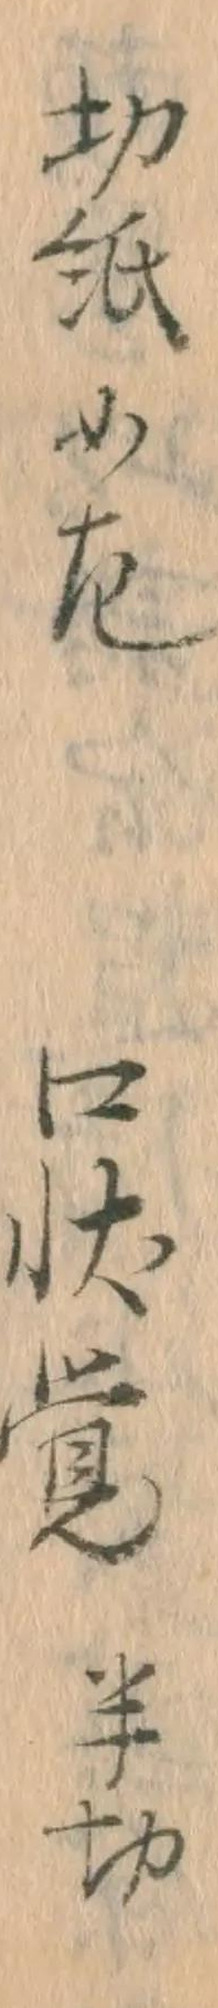切紙如左口伏覚半切
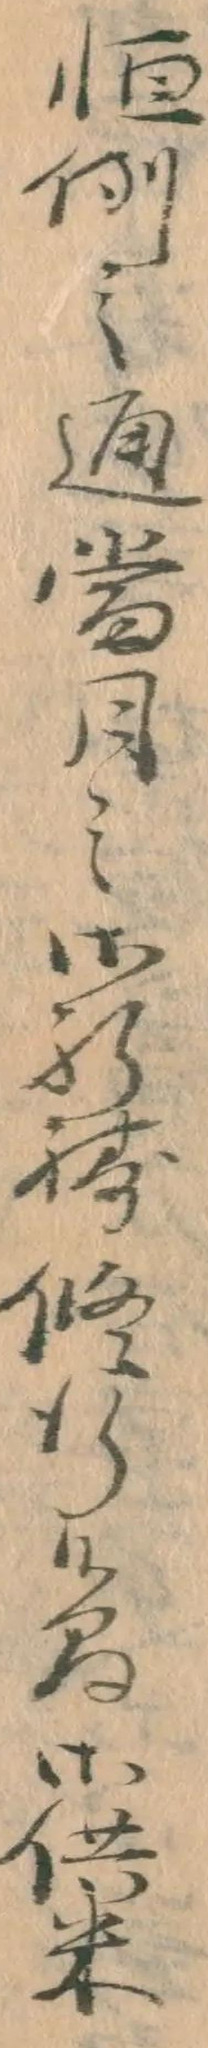恒例之通當月之御祈祷修行候間御供米
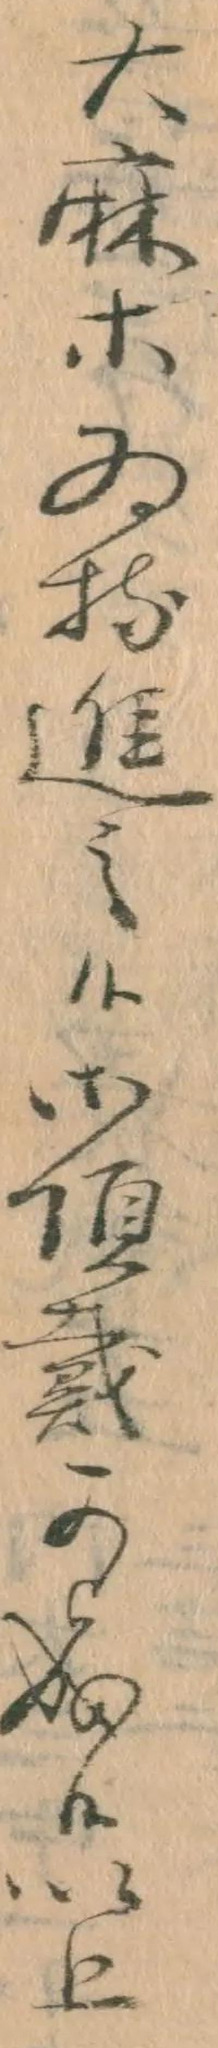大麻等為持進之候御頂戴可被成候以上
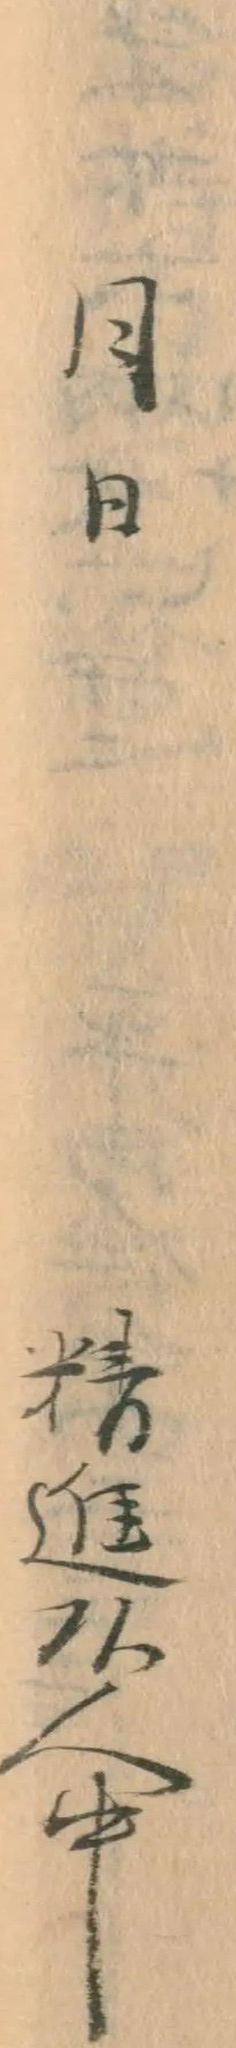月日精進頭人中
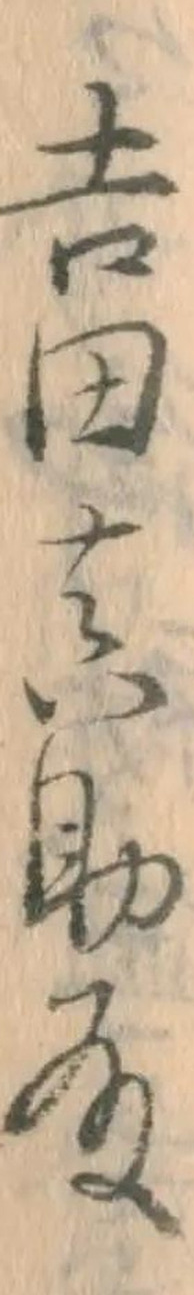吉田真助殿
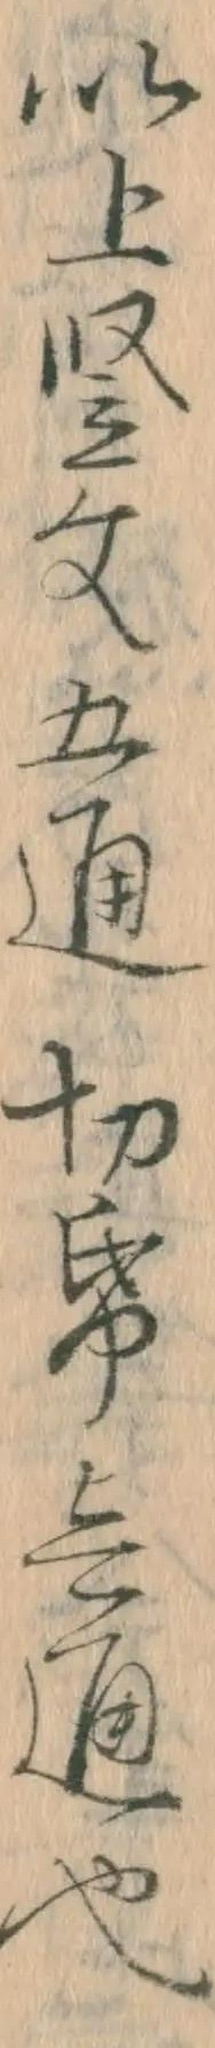以上竪文五通切紙壱通也
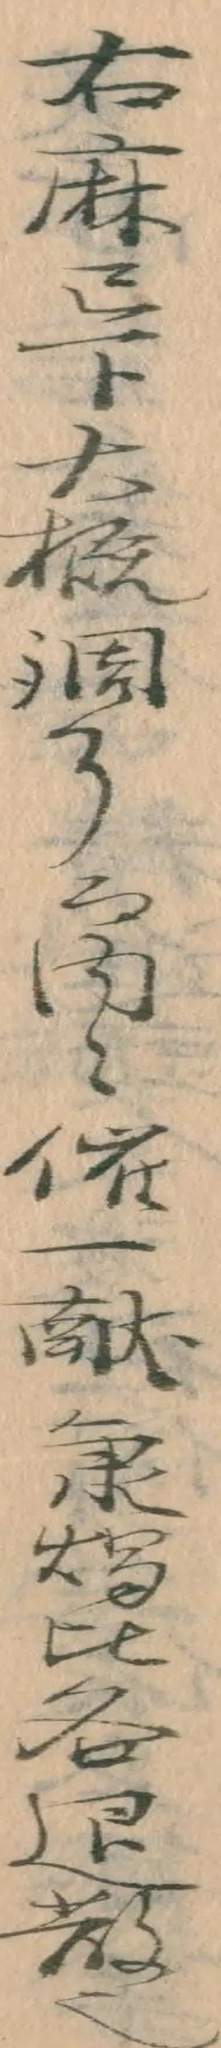右麻已下大概調了而内々催一献秉燭比各退散也
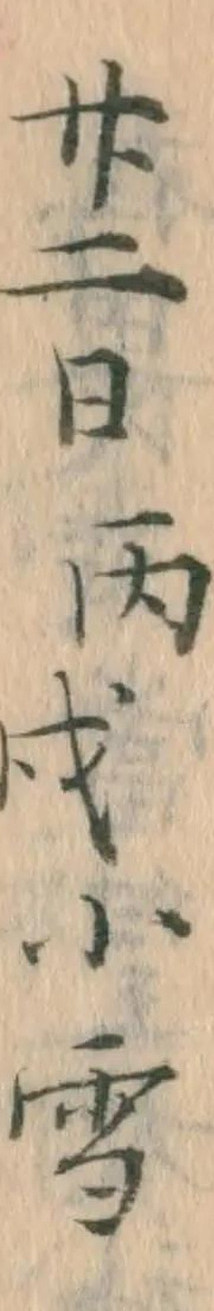廿二日丙戌小雪
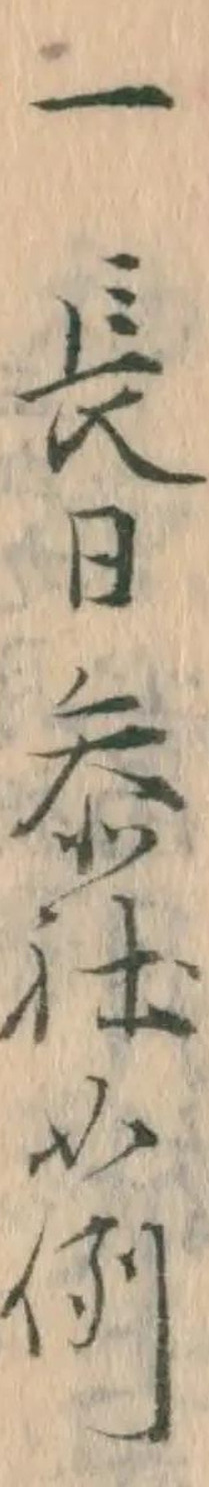一長日参社如例
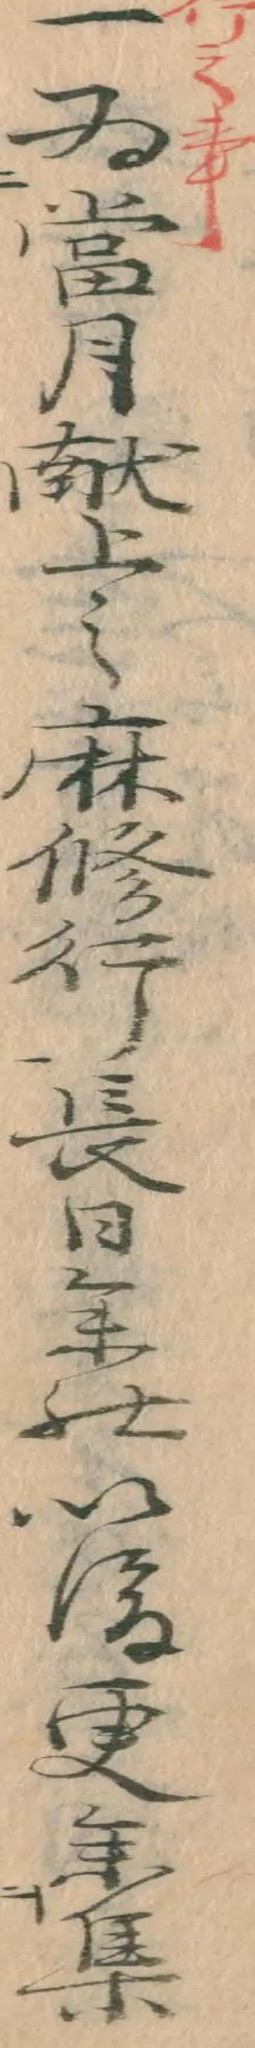一為當月献上之麻修行長日参社以後更参集
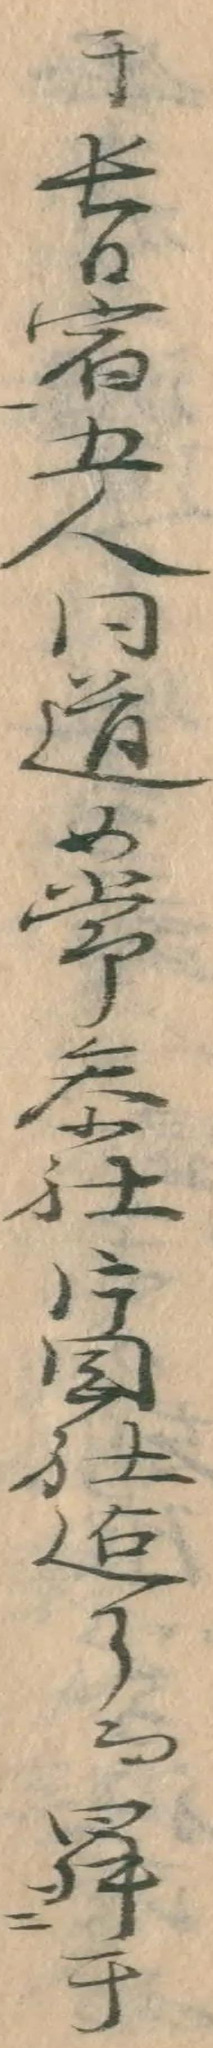于長日宿五人同道如常参社片岡社了而昇于
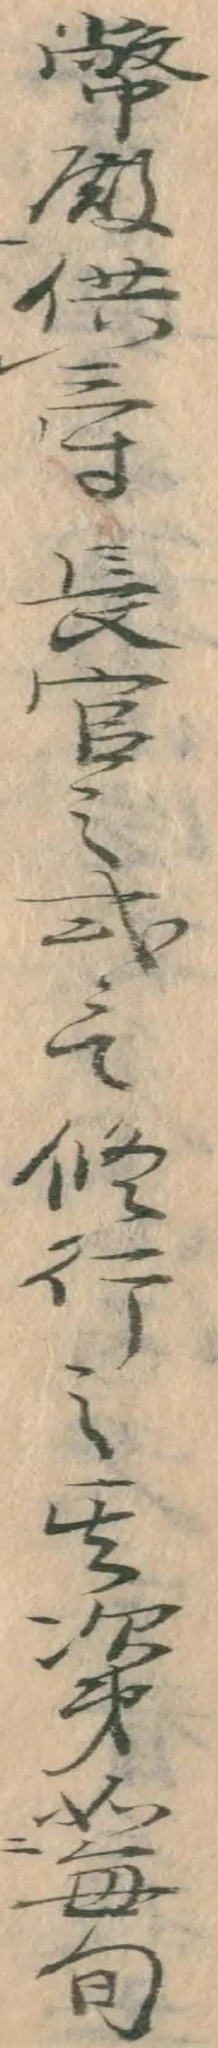幣殿供三寸長官之式ニて修行之其次第如毎旬
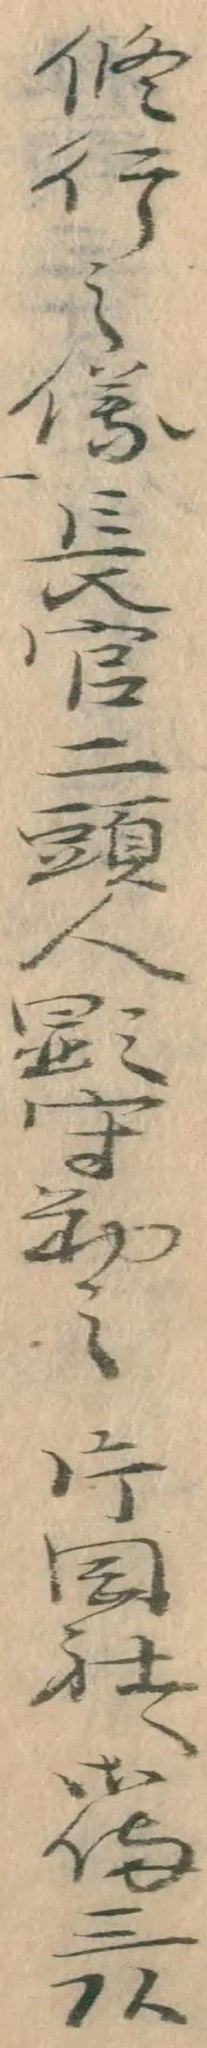修行之儀長官二頭人顕守勤之片岡社へ御備三頭
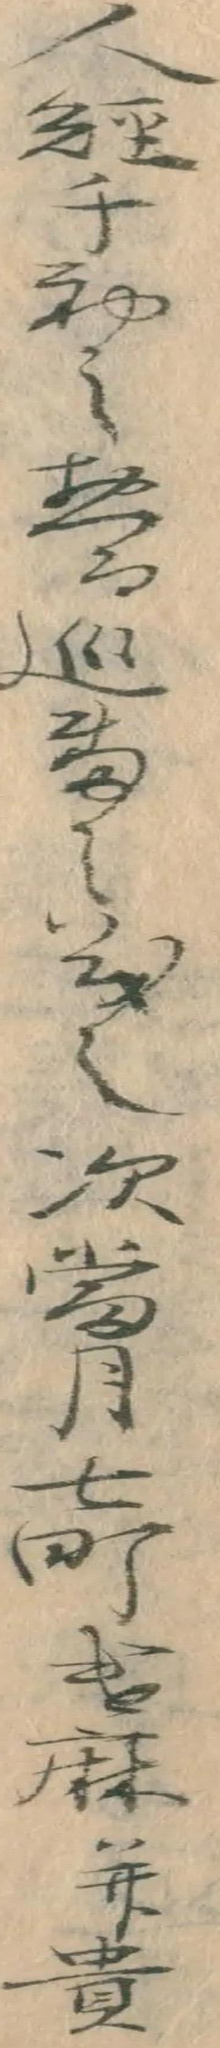人短千勤之惣而巡番之義也次當月七町義麻幷貴

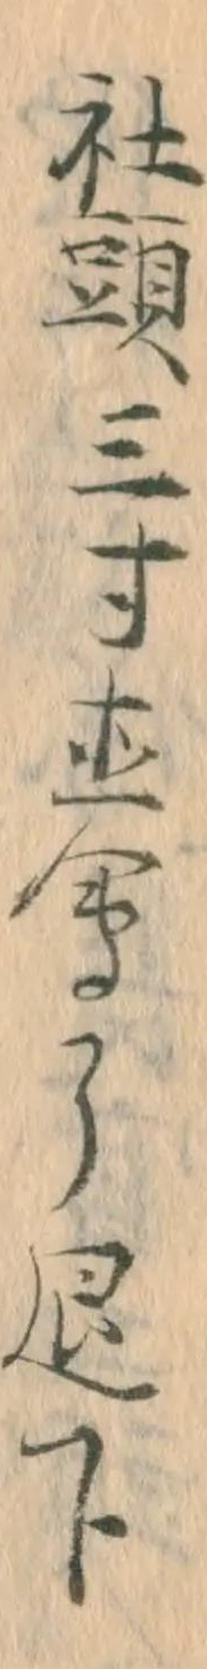社頭三寸直會了退下
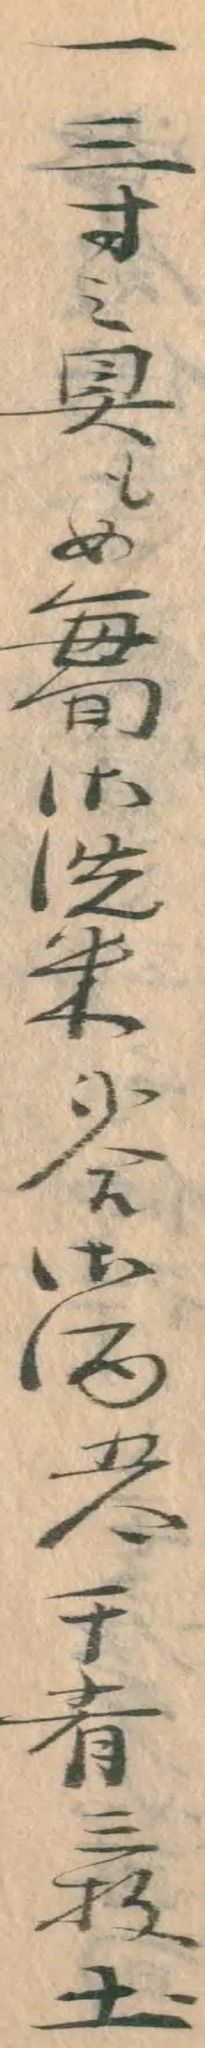一三寸之具も如毎旬御洗米弐合御酒五合干肴三枚土
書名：賀茂社記録. 第72冊
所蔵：国立国会図書館 National Diet Library, JAPAN
